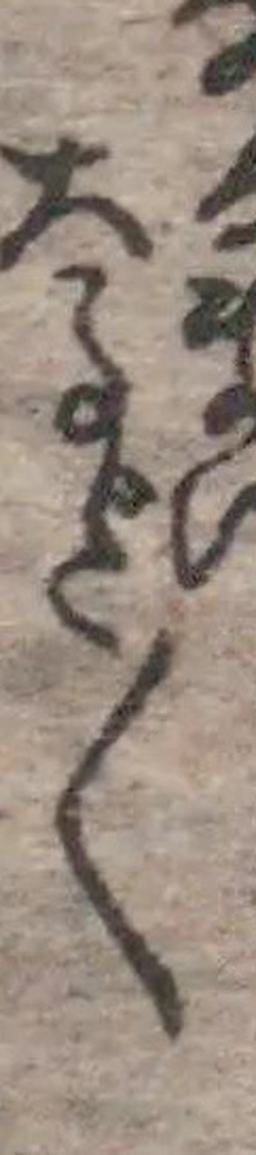大事だ〳〵

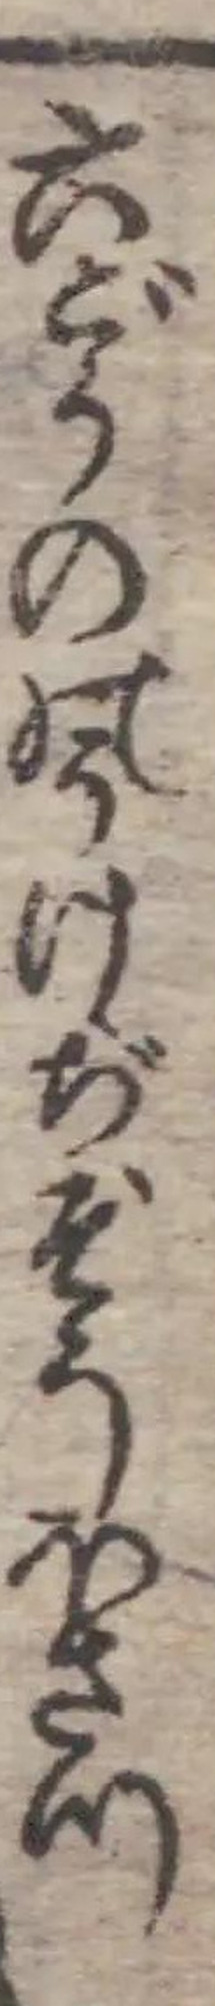六どうののうけぢそうほさつ
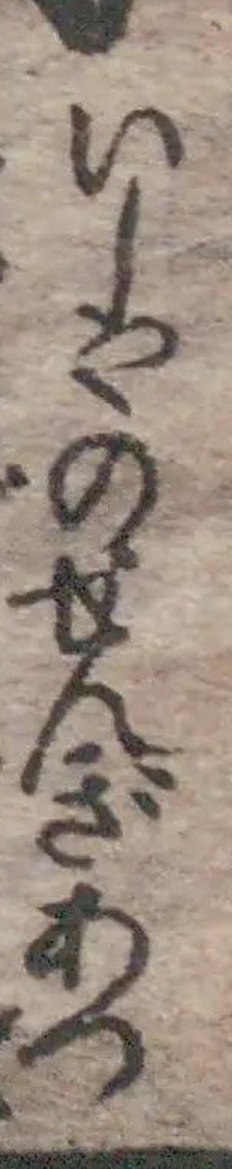いしやのせんぎあつて
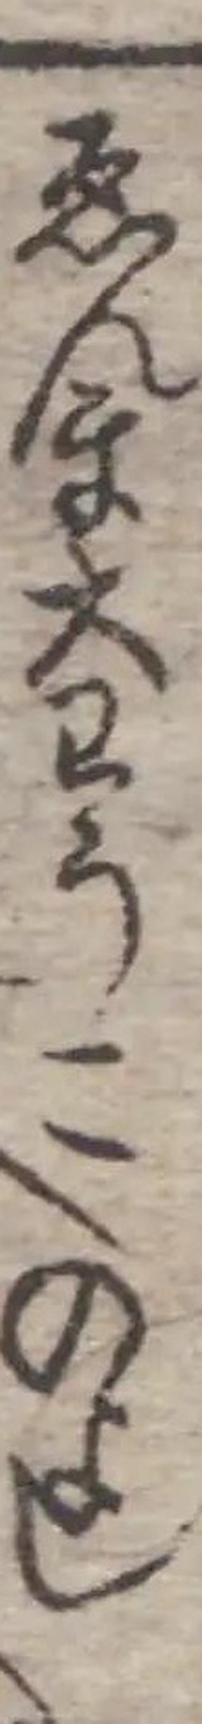ゑんま大わうこのよし
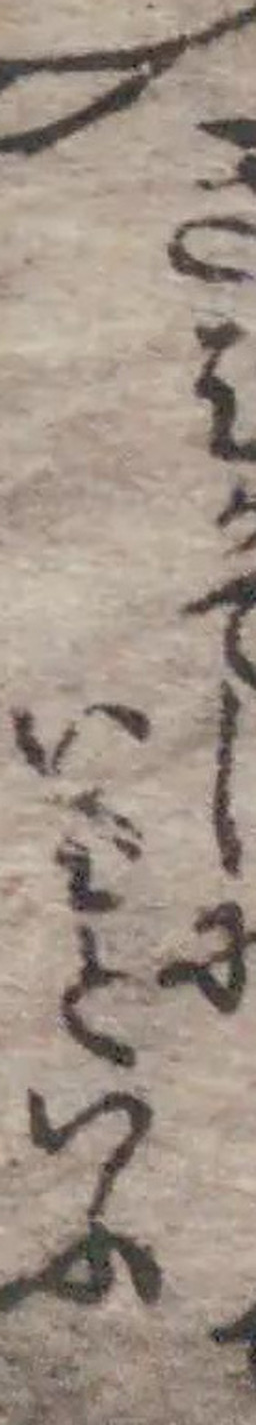いばといふ
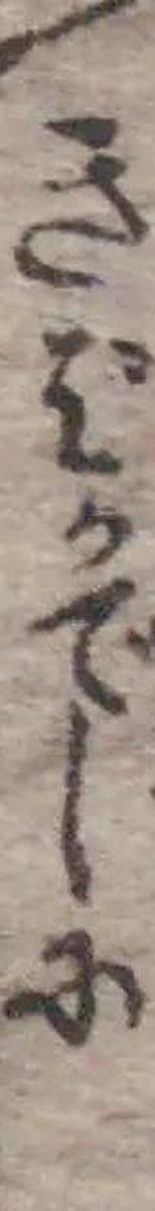きばかでしに
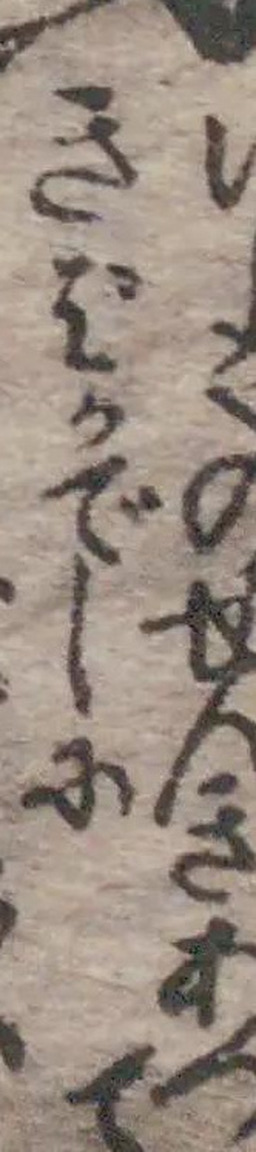きばかでしに
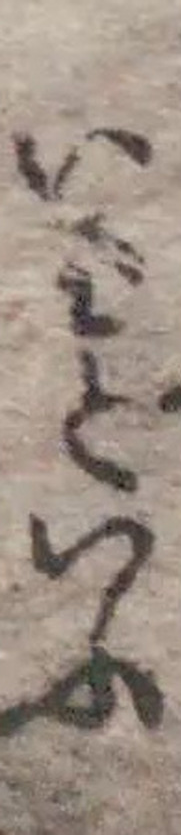いばといふ
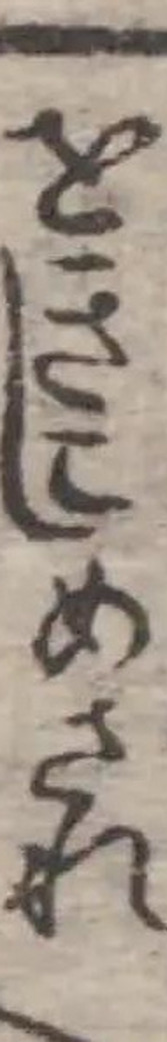をきこしめされ
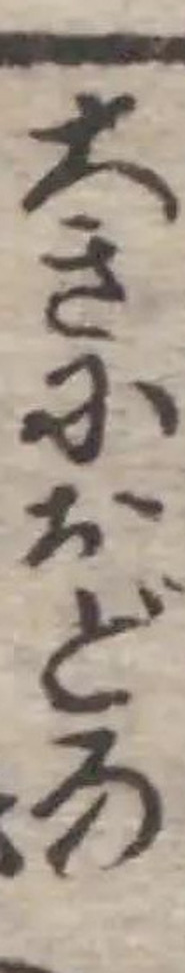大きにおどろ
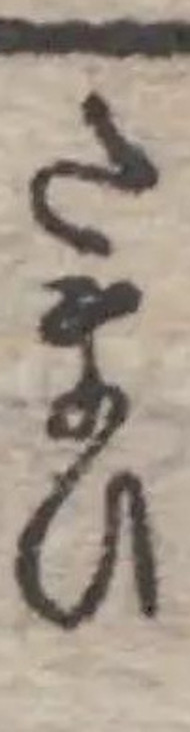たまひ
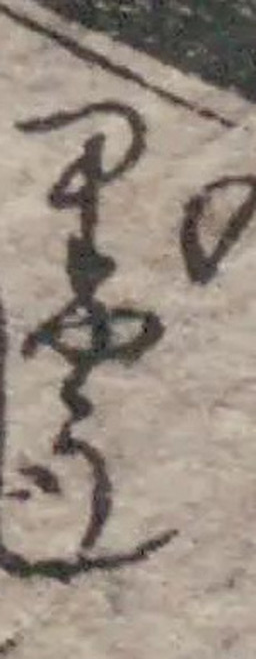りやうじ
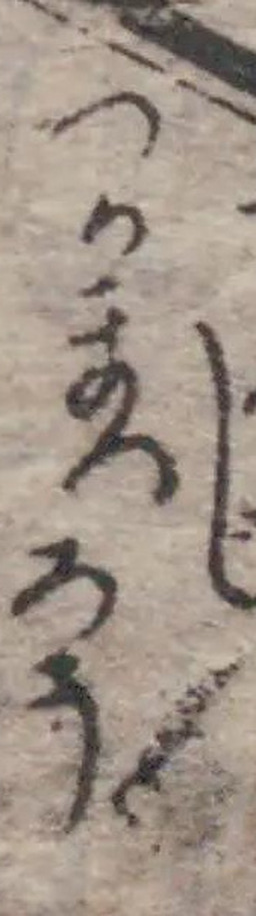つかまつろう
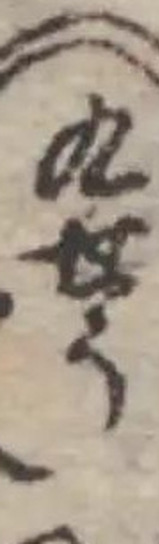九せう
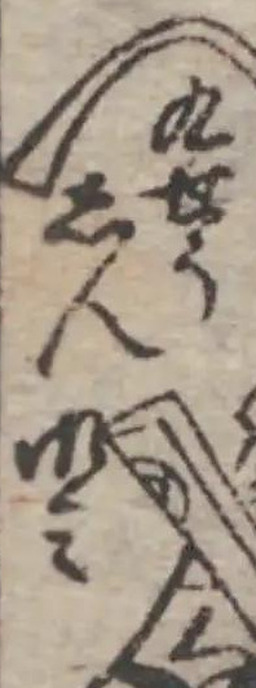しん御み
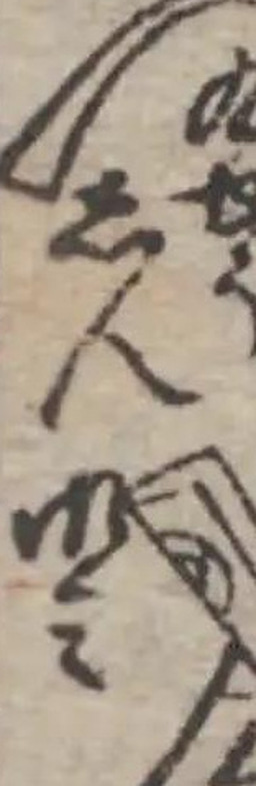しん御み
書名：大磯地蔵咄 2巻
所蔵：国立国会図書館 National Diet Library, JAPAN
